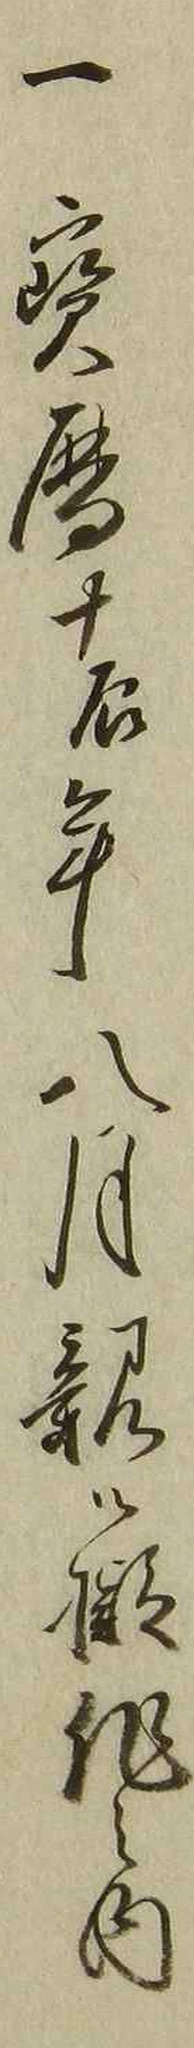一宝暦十辰年八月親御擬作之内
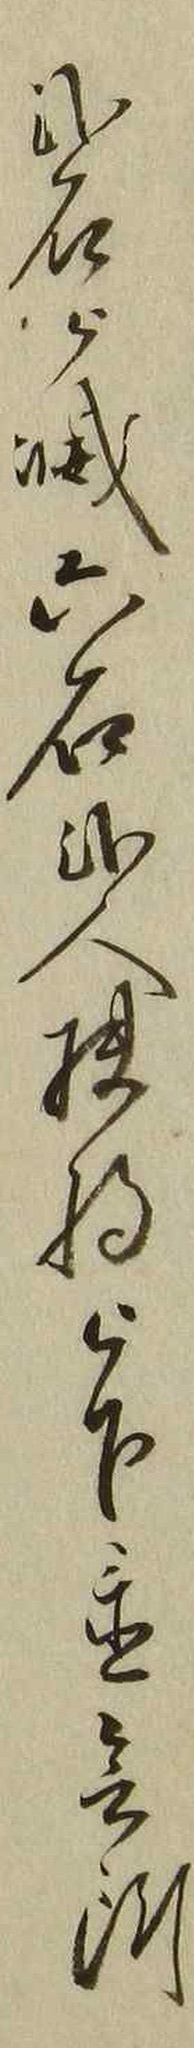弐石被減六石弐人扶持被下置会所
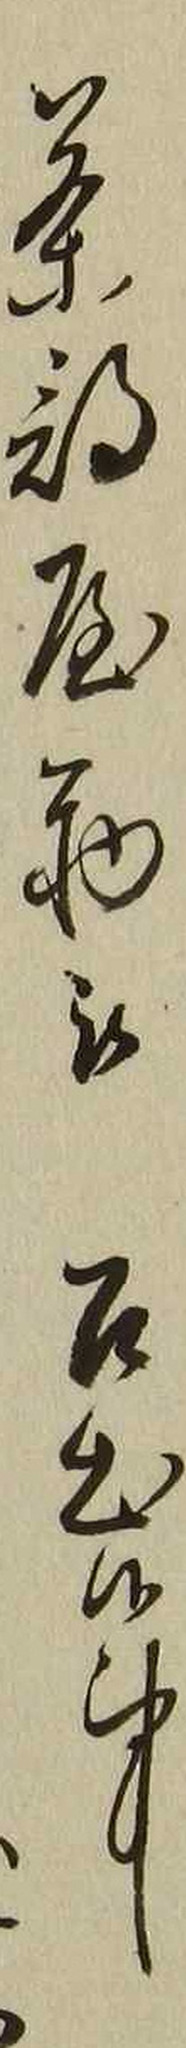茶部屋勤被召出候事
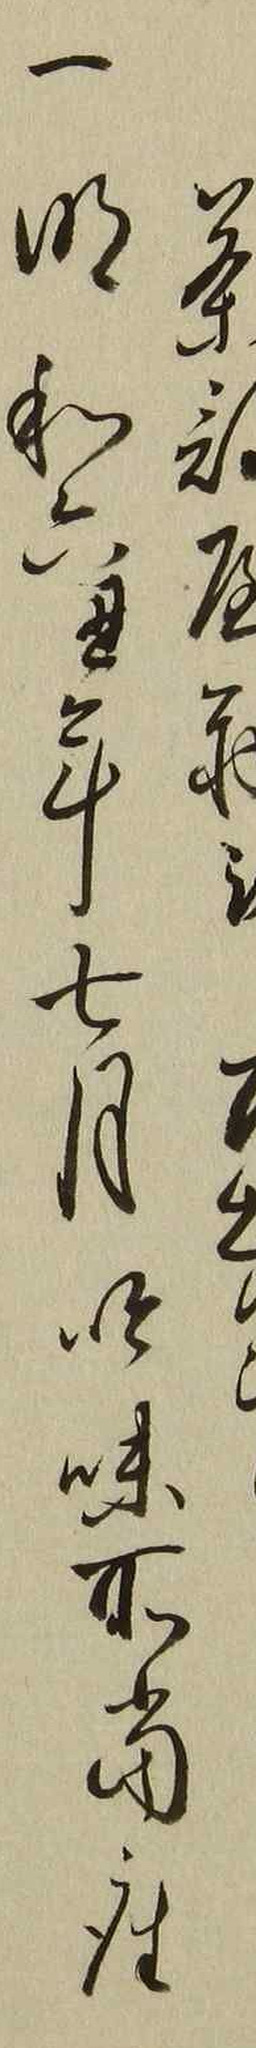一明和六丑年七月吟味所当座
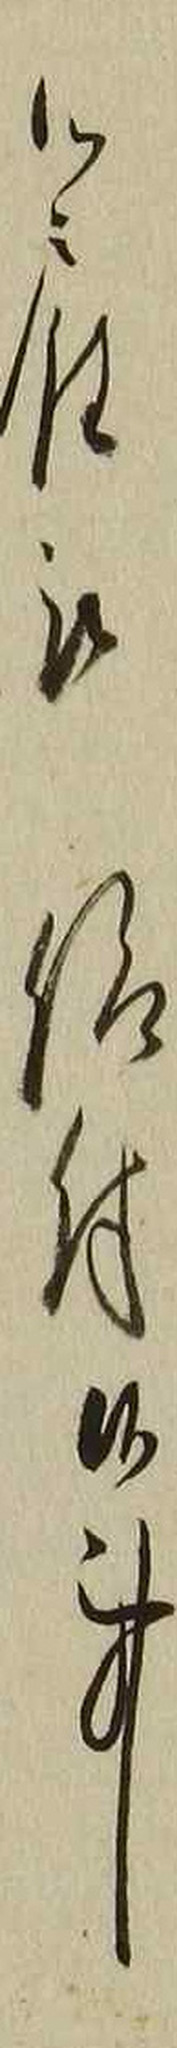御雇被仰付候事
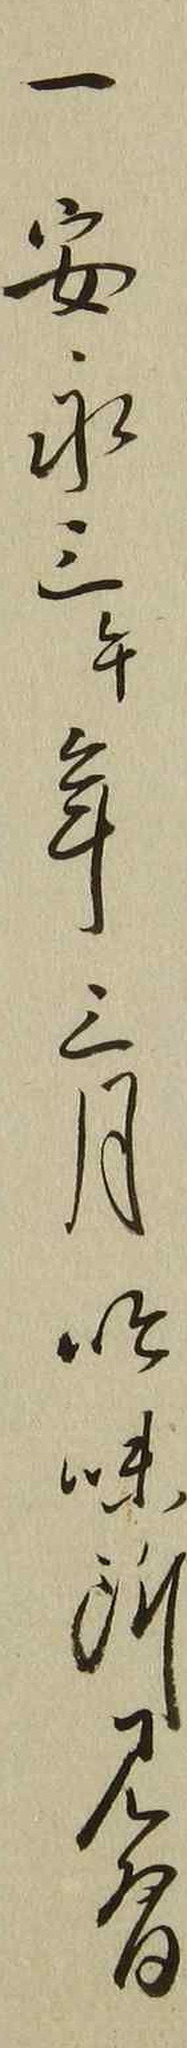一安永三午年三月吟味所見習
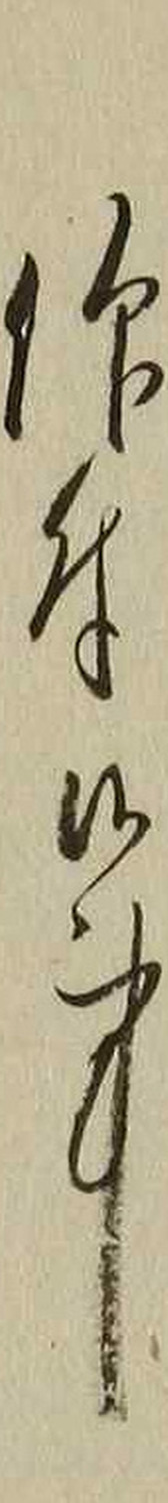仰付候事
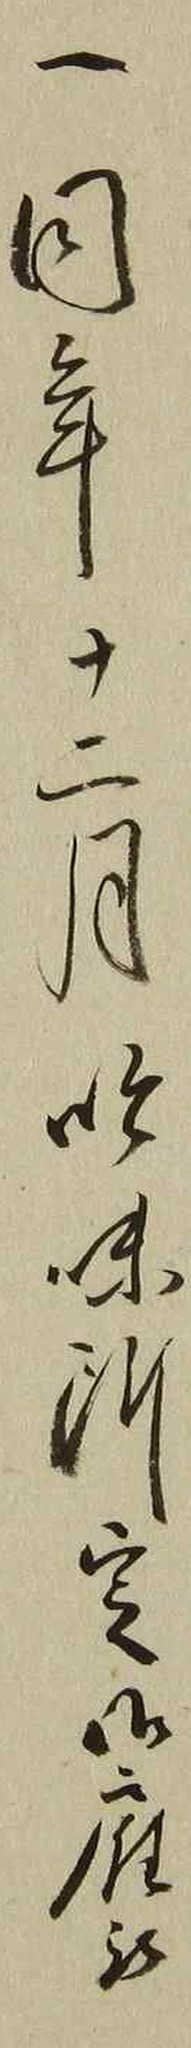一同年十二月吟味所定御雇被
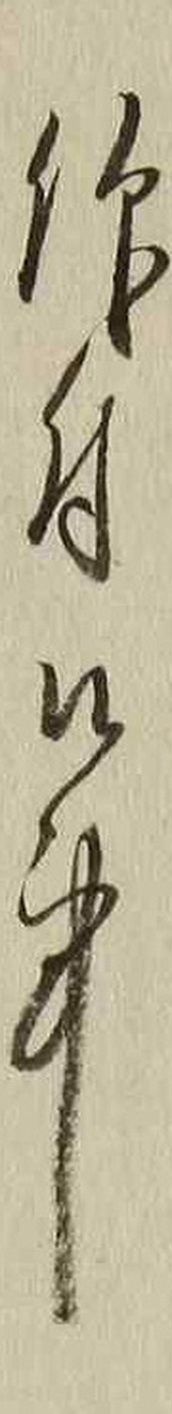仰付候事
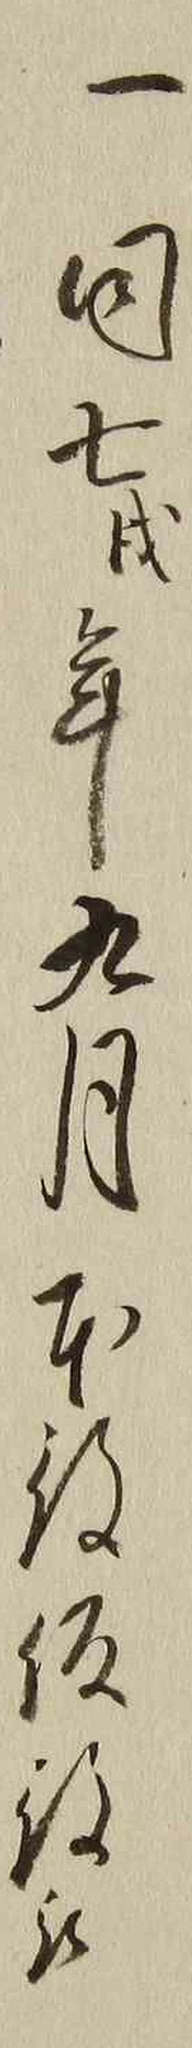一同七戌年九月本役仮役被
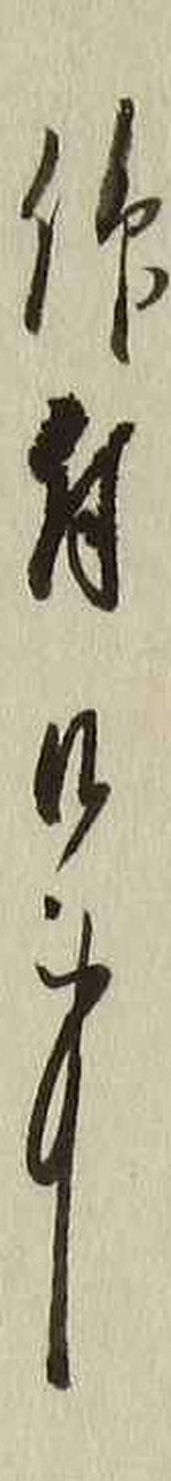仰付候事
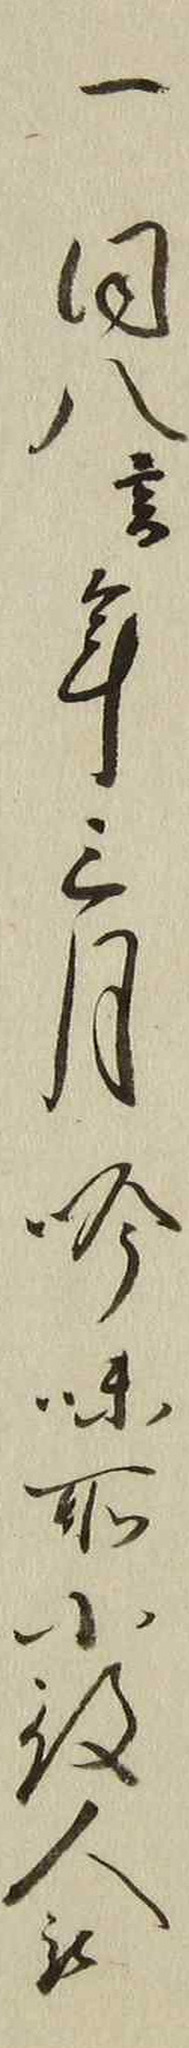一同八亥年三月吟味所小役人被
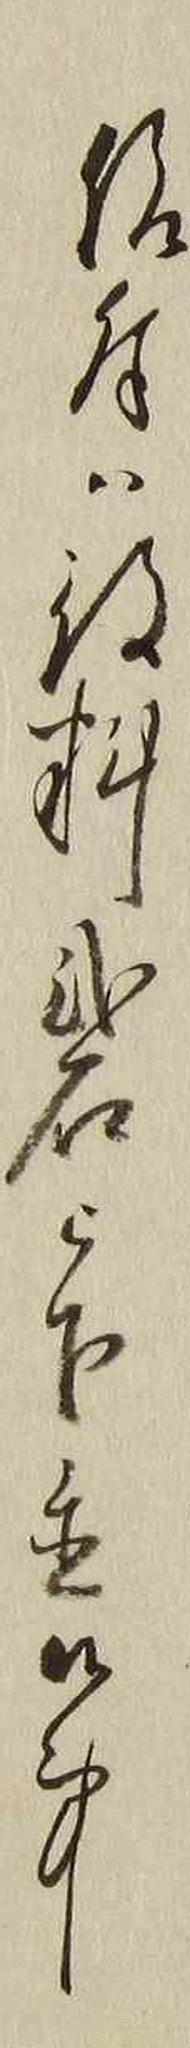仰付御役料弐石被下置候事
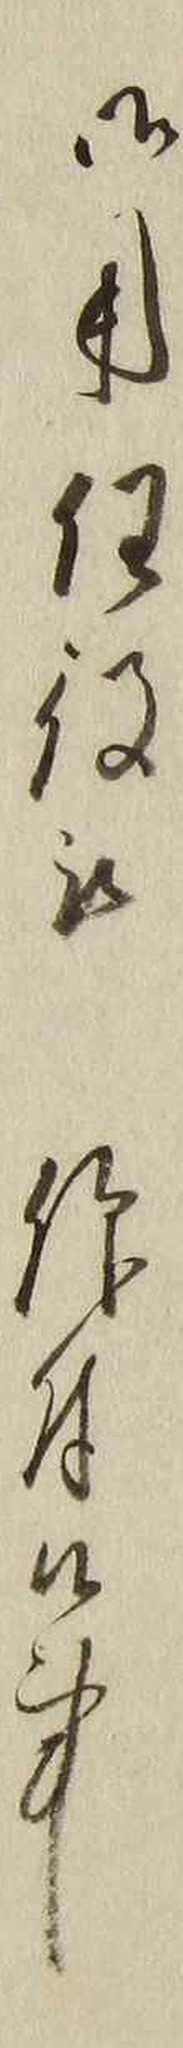御用任役被仰付候事
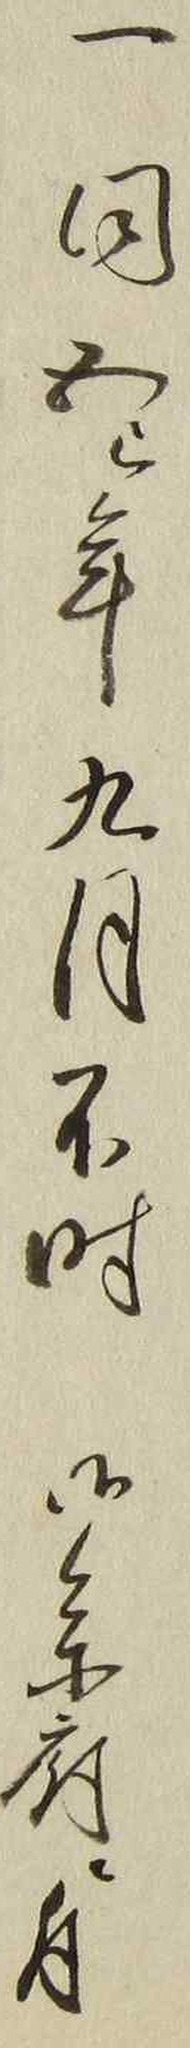一同五巳年九月不時御参府ニ付
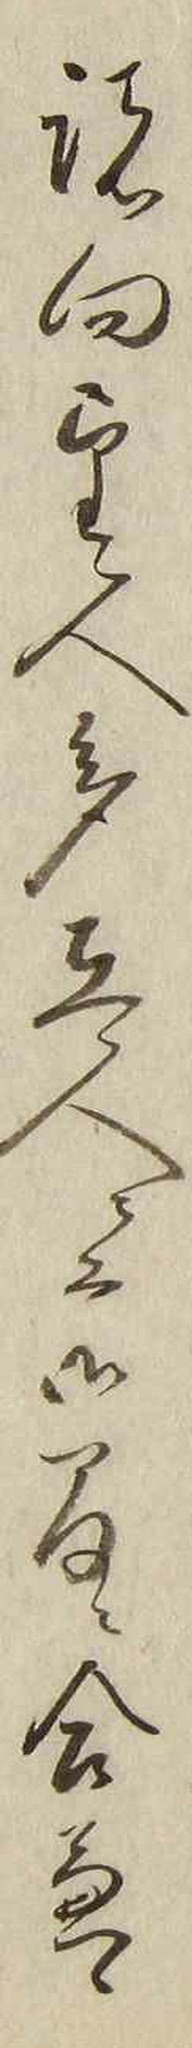諸向望人多壱人ニ而御間ニ合兼候
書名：諸士系譜　巻之132　た之部8
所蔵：会津若松市立会津図書館
